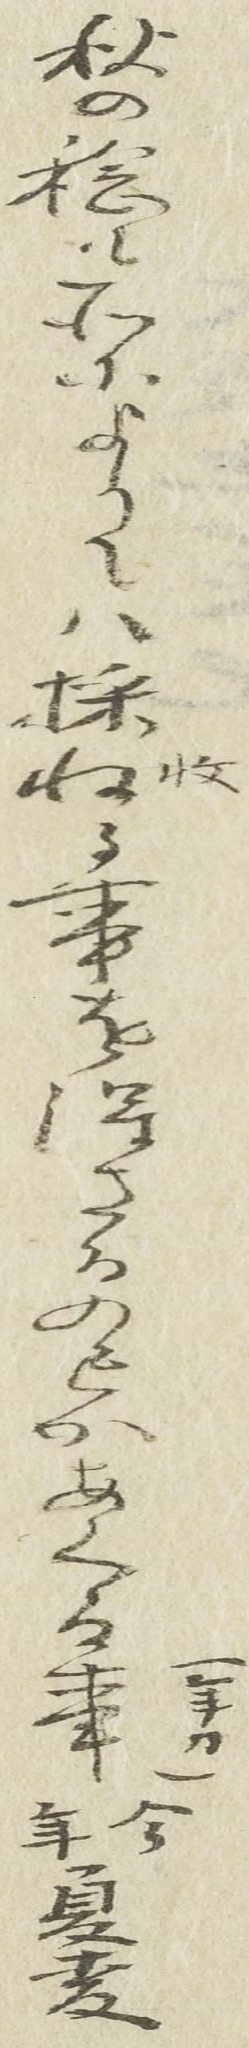秋の稔も所によりては採ねる事を得さるの已かあくる事今年夏麦
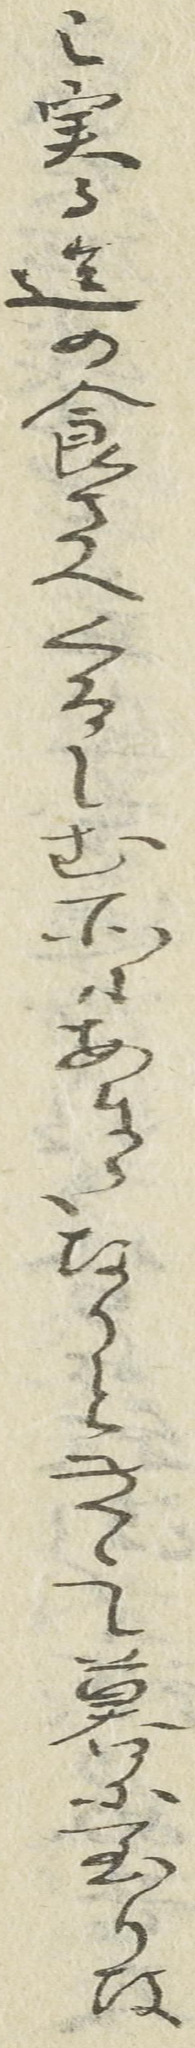之実る迄の食さへくるしむ所もあまたなりときゝて暮に至りな
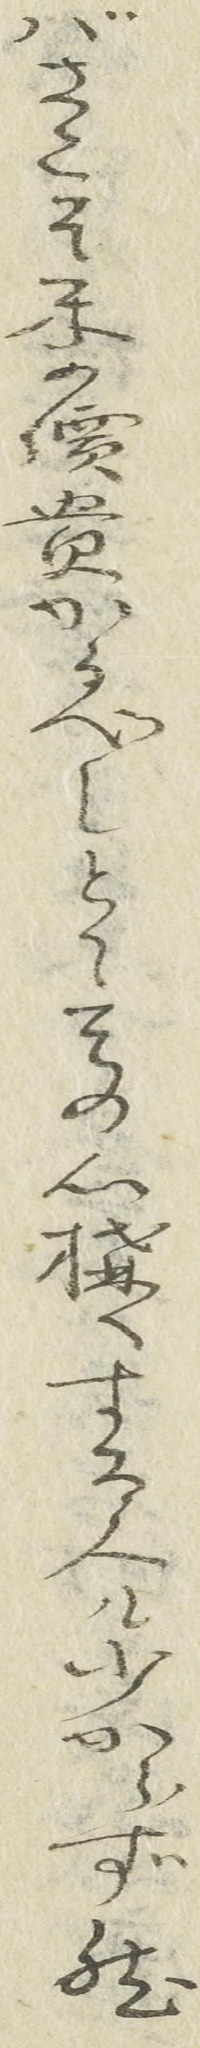ばさこそ米の價貴かるべしとてその心構へする人も少からず然
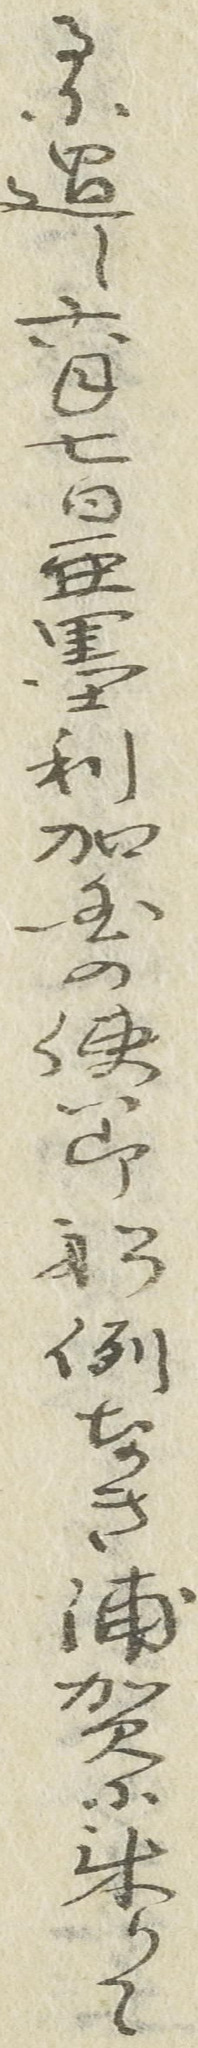るに過し六月七日亜墨利加国の使節船例なき浦賀に来りて
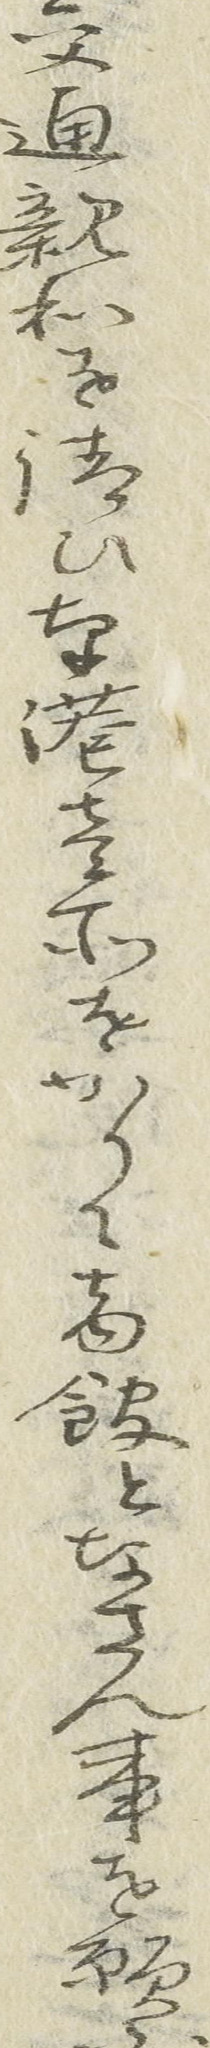交通親和を請ひ奉港壱所をかりて商館となさん事を願ふ
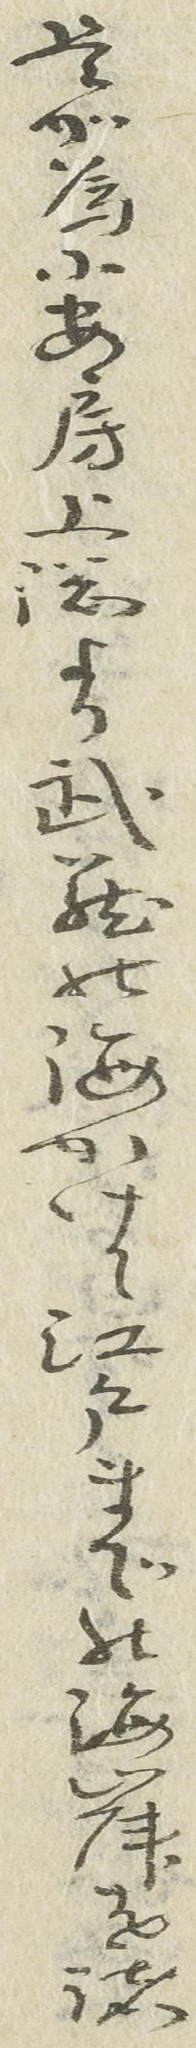是が為に安房上総より武蔵の海かけて江戸までの海岸を諸
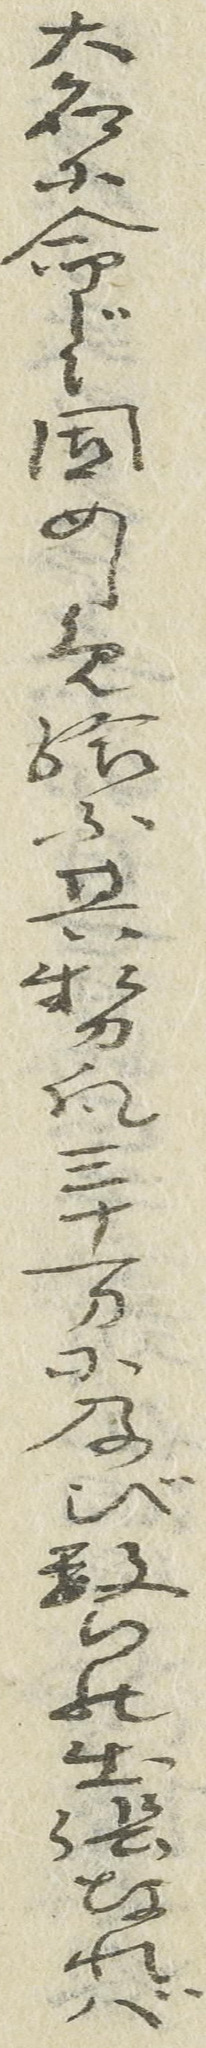大名に命じて固めしめ給ふ其勢凡三十万に及び数日の出張なれば
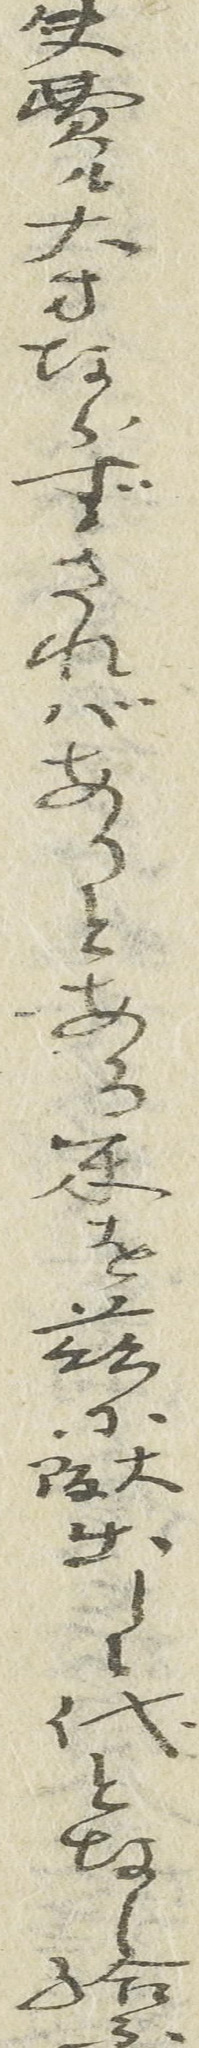失費も大方ならずさればありとある米を茲に献出して代となし給ふ
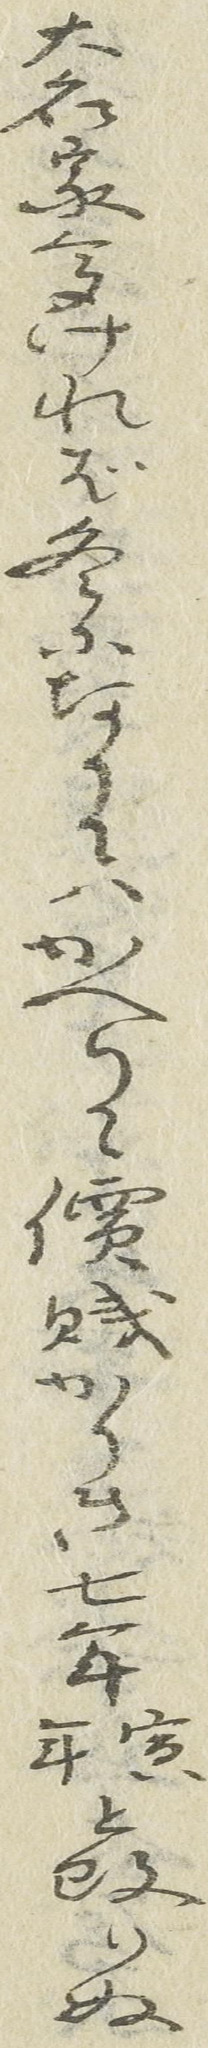大名家多ければ冬になりてはかへりて價賎かりき七年寅年と改りぬ
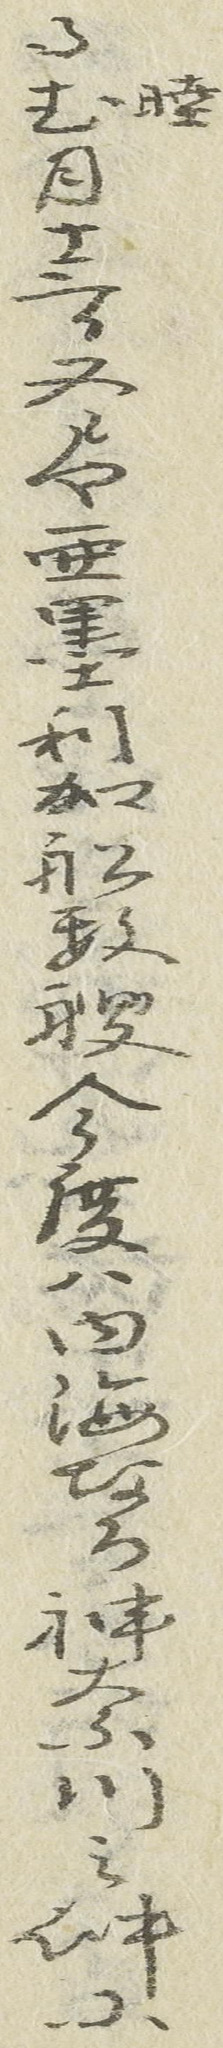事む月十三日又もや亜墨利加船数艘今度は内海なる神奈川之沖に
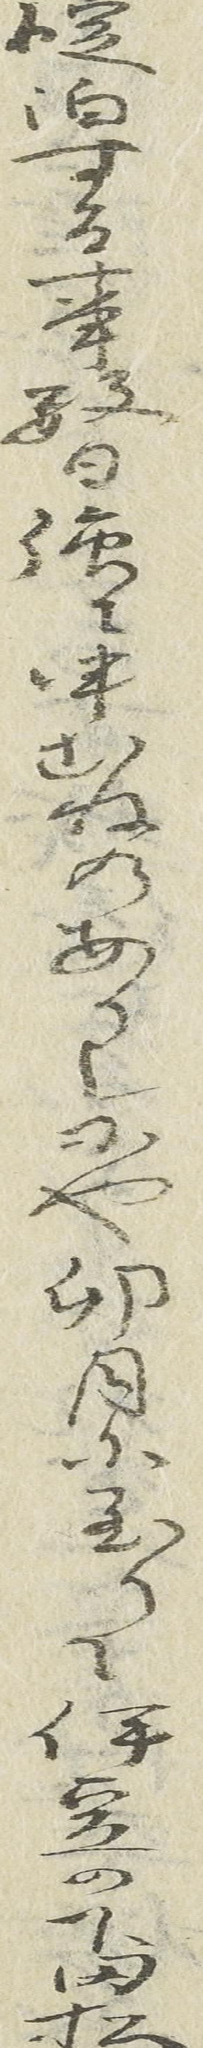碇泊する事数日強に申むねのありしにや卯月に至りて伊豆の下田松
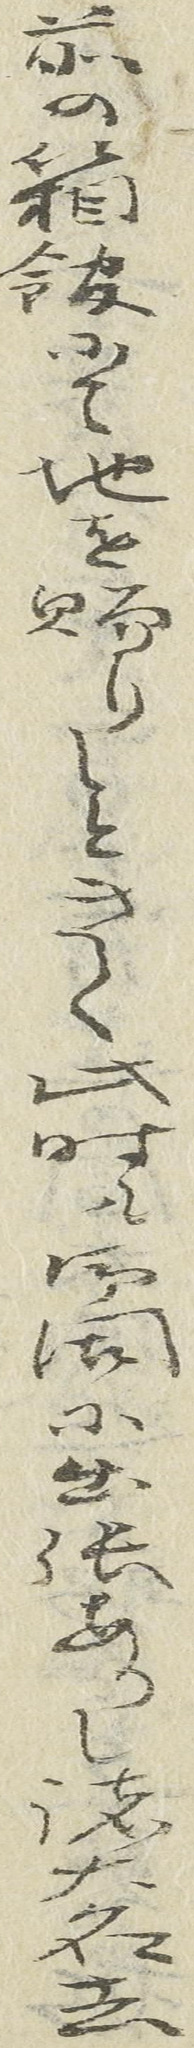前の箱館にて地を賜りしときく此時も御固に出張ありし諸大名去

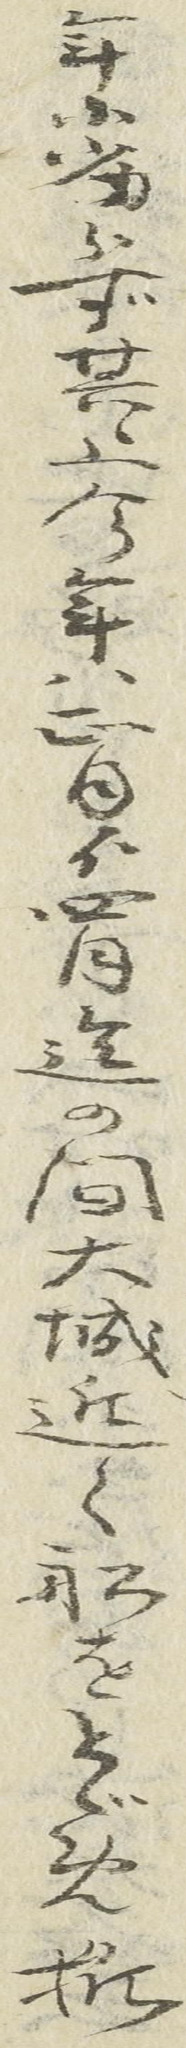年に省らず其上今年は正月より四月迄の間大城近く船をとどめ折
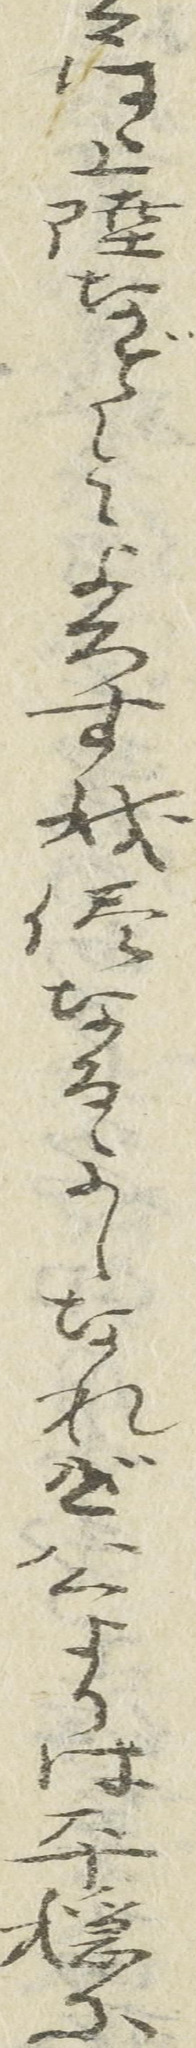々は上陸などしてよろす我儘なるよしなれど公よりは平穏に
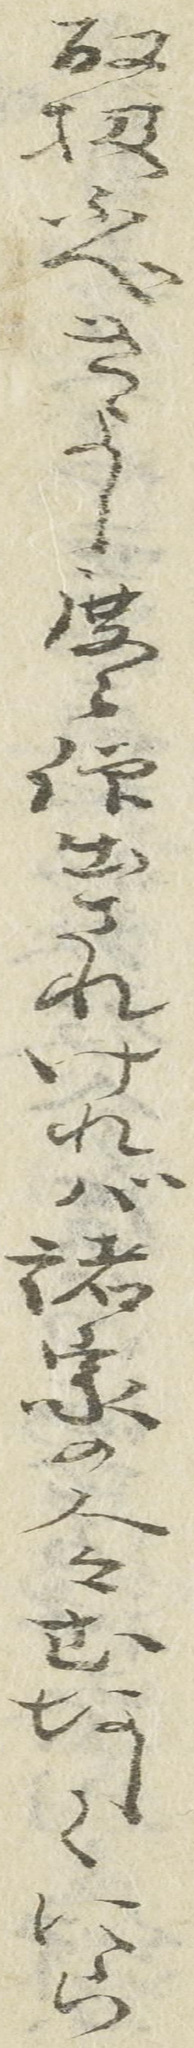取扱ふべきよし度々仰出されければ諸家の人々むなしくにら
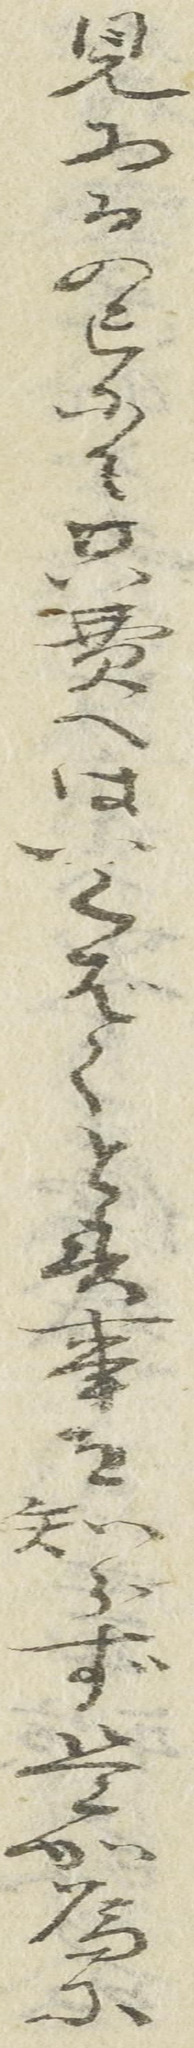見ゐるの已にて只費へはいくばくと来事を知らず是が為に
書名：地震前兆集　全
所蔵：東京大学地震研究所図書室 Earthquake Research Institute Library, The University of Tokyo, JAPAN
